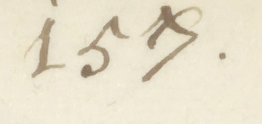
157
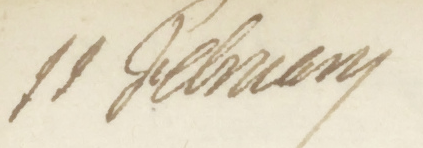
11 February
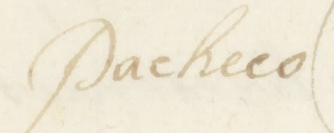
Pacheco
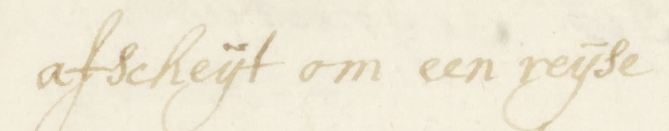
afscheijt om een reijse
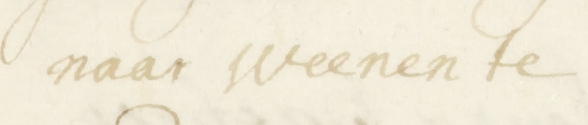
naar Weenen te
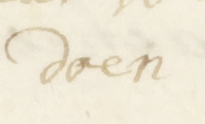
doen
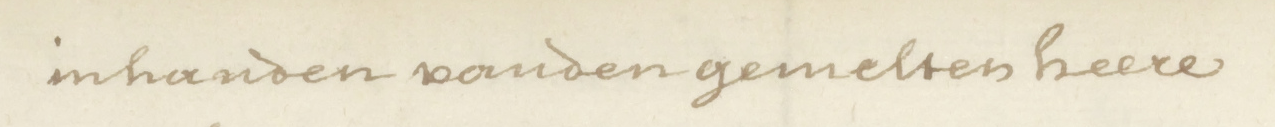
in handen vanden gemelten heere
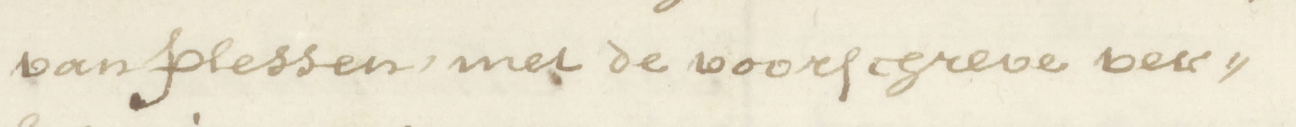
van Plessen, met de voorschreve ver„
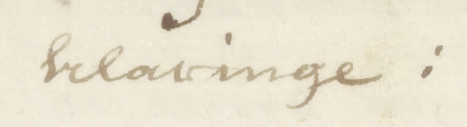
klaringe:
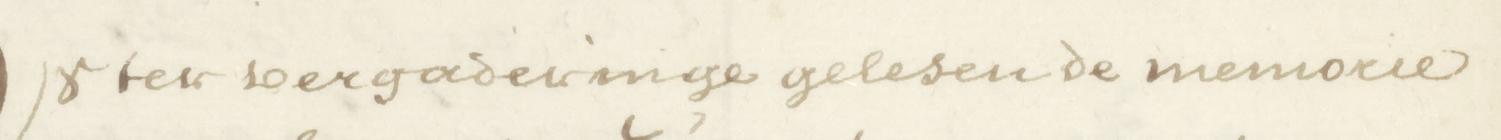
Is ter vergaderinge gelesen de memorie
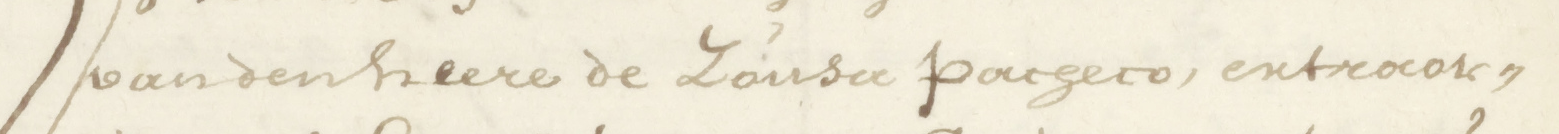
van den heere Zousa Pacheco, extraor„
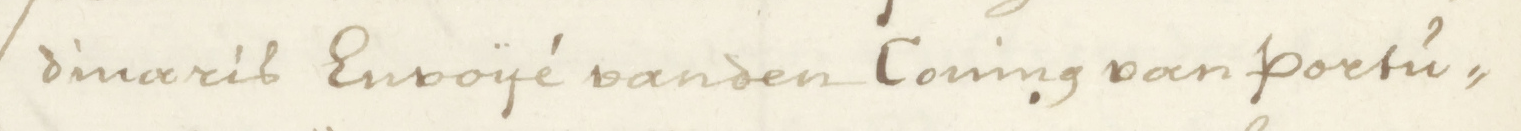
dinaris Envoijé vanden Coning van Portu„
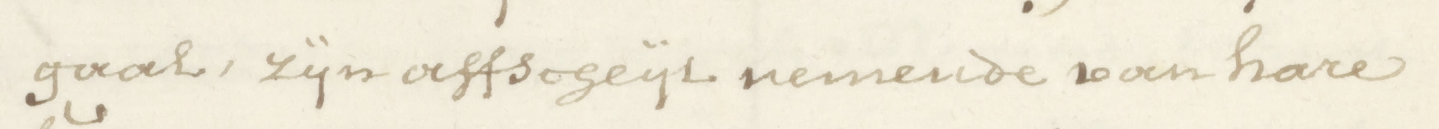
gaal, zijn affscheijt nemende van hare
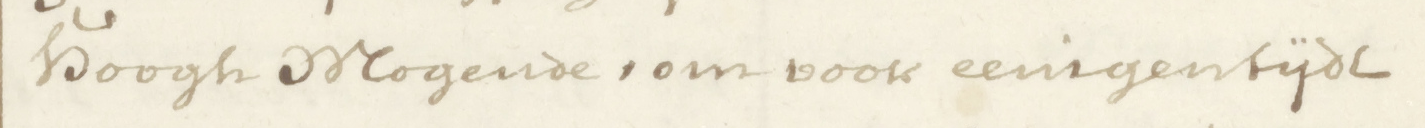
Hoogh Mogende, om voor eenigen tijdt
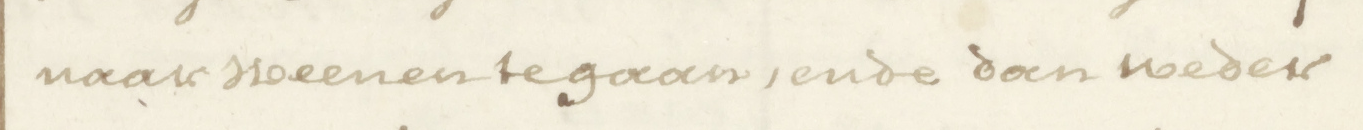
naar Weenen te gaan, ende doen weder
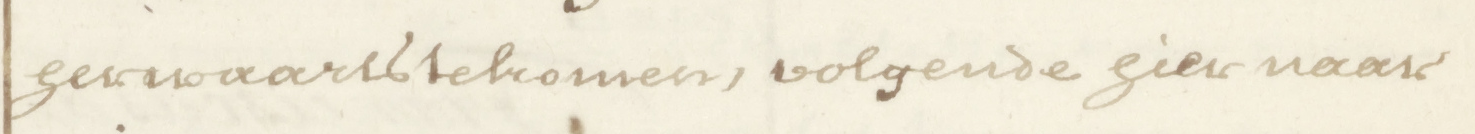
herwaarts te komen, volgende hier naar
